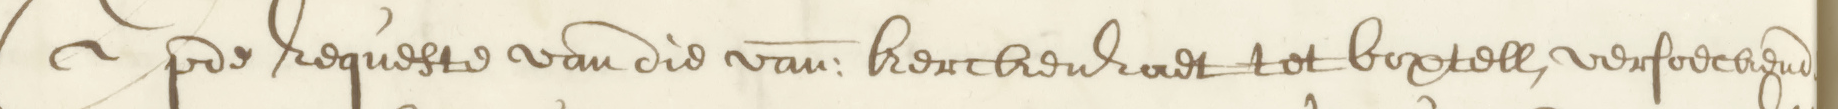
Opde Requeste van die van: kerckenraet tot boxtell, versoeckend
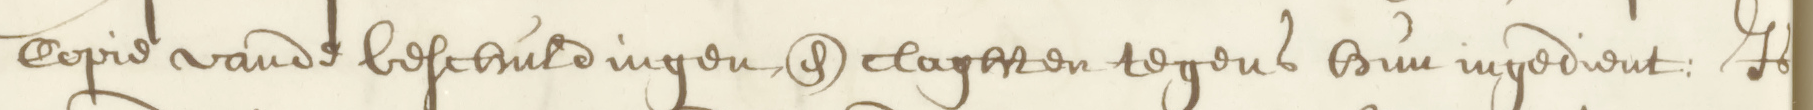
Copie vande beschuldingen, & claghten tegens hun ingedient: Is
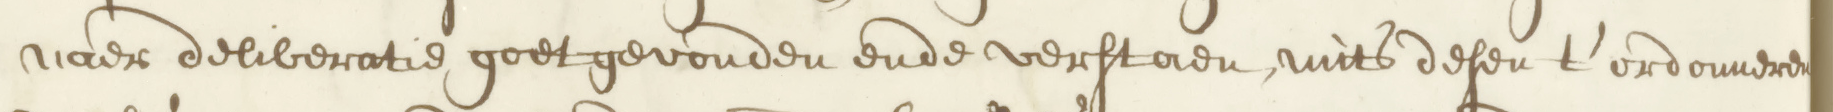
naer deliberatie goetgevonden ende verstaen, mits desen t'ordonneren
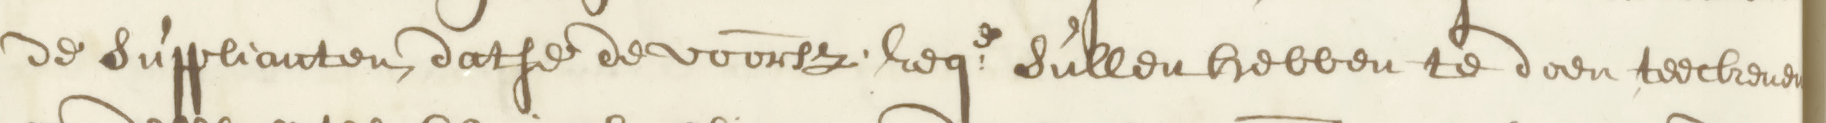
de Supplianten, datse de voorsr: reqe. sullen hebben te doen teeckenen
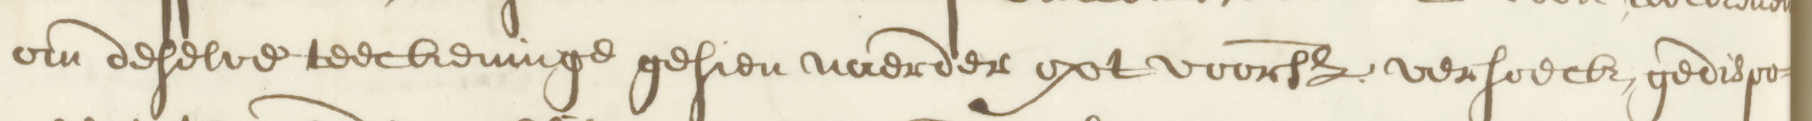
om deselve teeckeninge gesien naerder opt voorsr. versoeck, gedispo,,
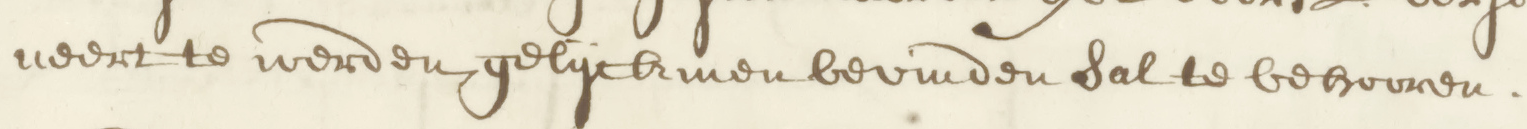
neert te werden gelijck men bevinden sal te behooren. —
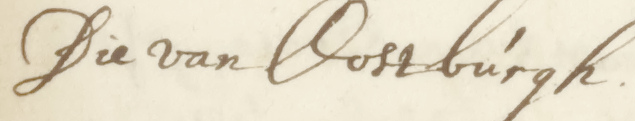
Die van Oostburgh.
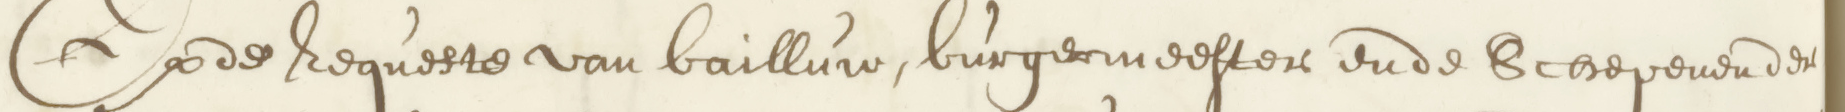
Opde Requeste van bailluw, burgermeester ende Schepenen der
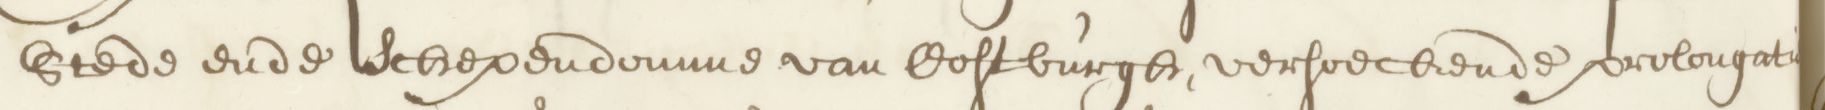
Stede ende Schependomme van Oostburgh, versoeckende prolongatie
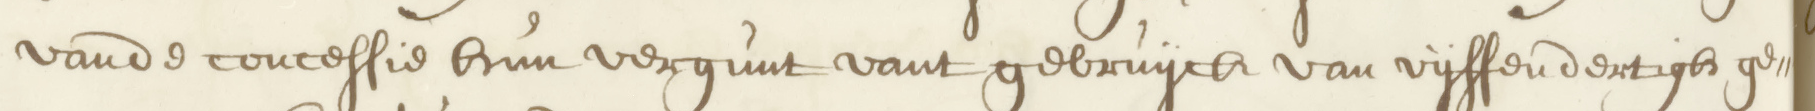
vande concessie hun vergunt vant gebruijck van vijffendertigh ge,,
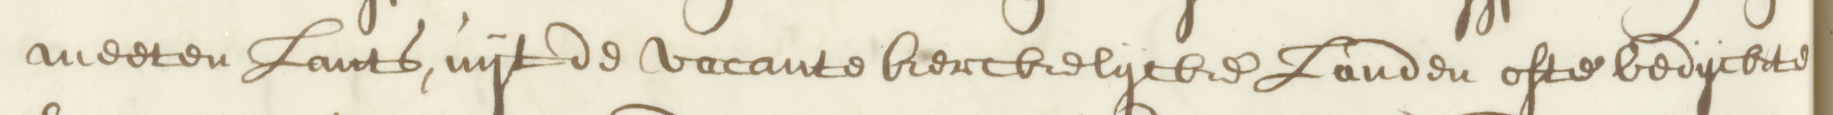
meeten Lants, uijt de vacante kerckelijcke Landen ofte bedijckten
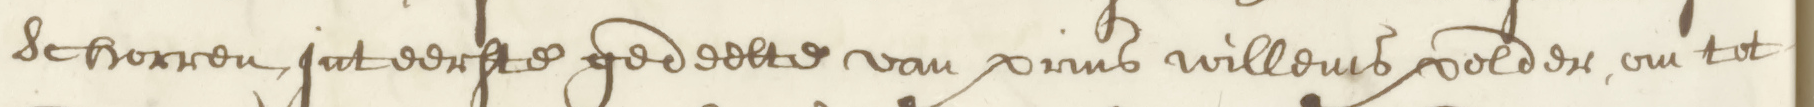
schorren, int eerste gedeelte van prins willems polder, om tot
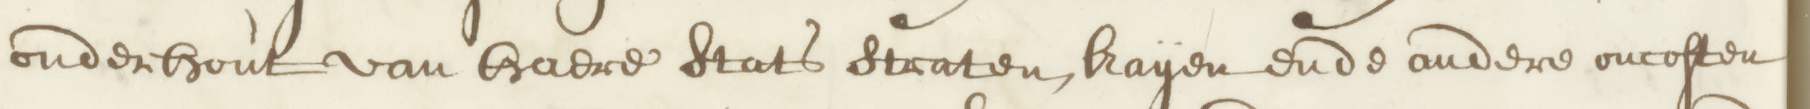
onderhout van haere stats straten, kaijen ende andere oncosten
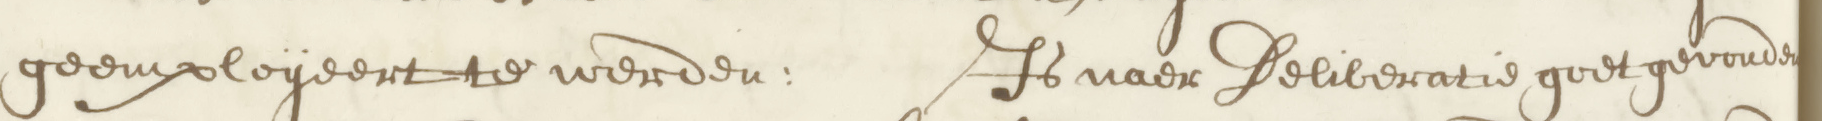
geemploijeert te werden: Is naer Deliberatie goetgevonden
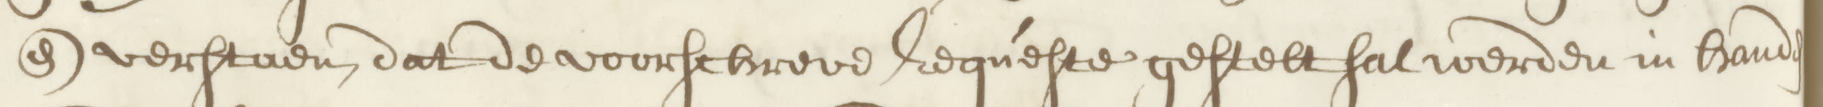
& verstaen, dat de voorschreve Requeste gestelt sal werden in handen
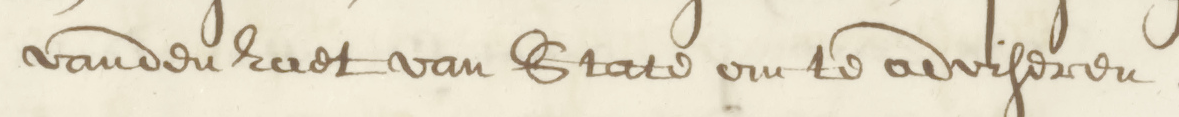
van den Raet van State om te adviseren. —
